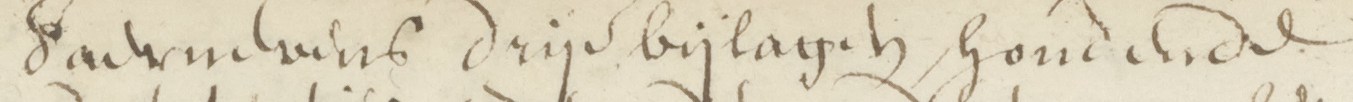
daernevens drije bijlagen, houdende
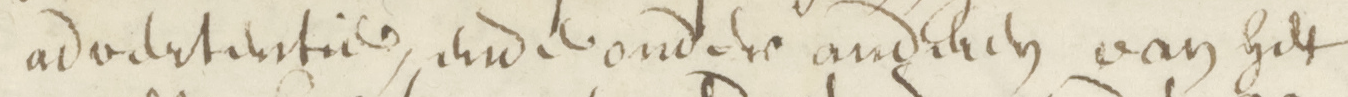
advertentie, ende onder anderen van het
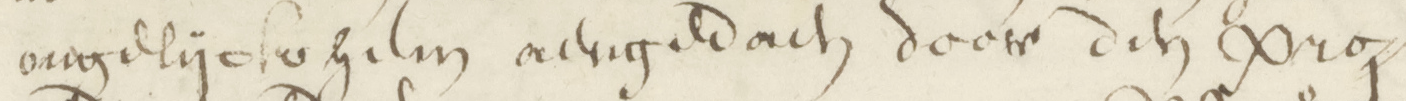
ongelijck hem aengedaen door den Pro„
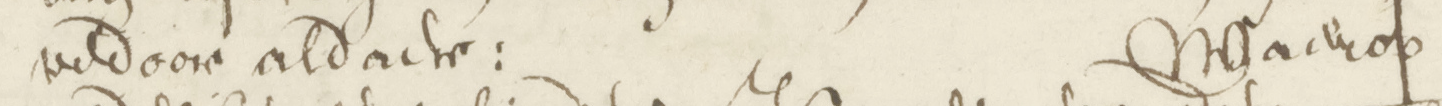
vedoor aldaer: Waerop
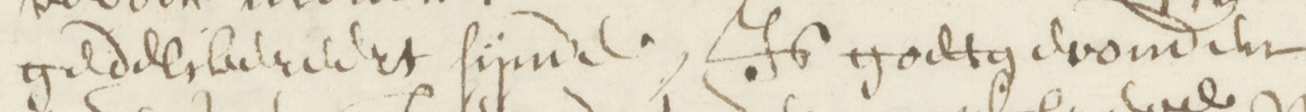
gedelibereert sijnde, Is goetgevonden
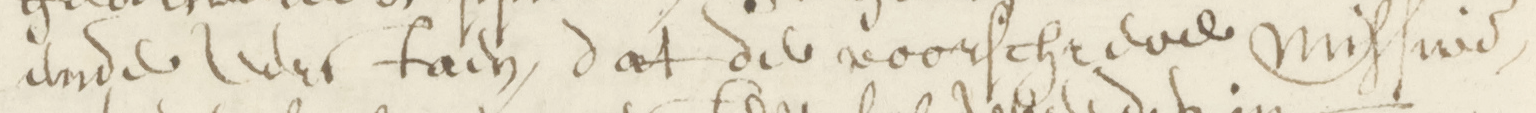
ende verstaen, dat de voorschreve Missive,
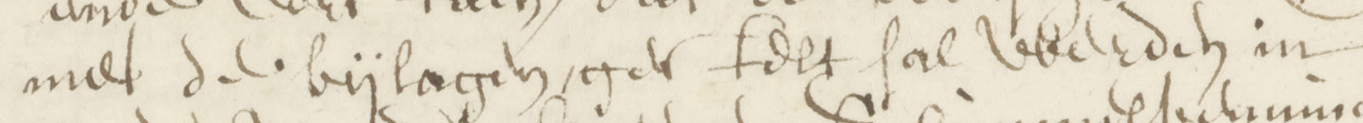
met de bijlagen, gestelt sal werden in
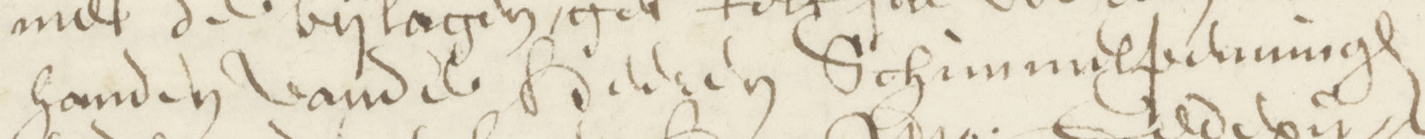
handen vande Heeren Schimmelpenningh
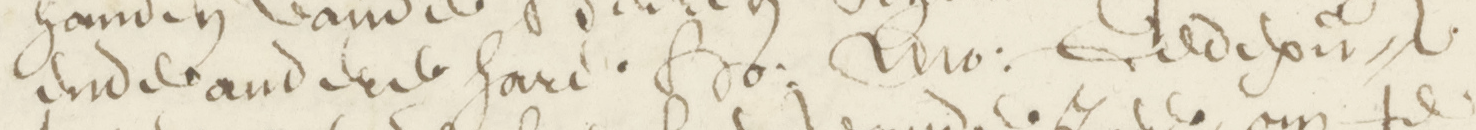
ende andere hare Ho:Mo: Gedepu„
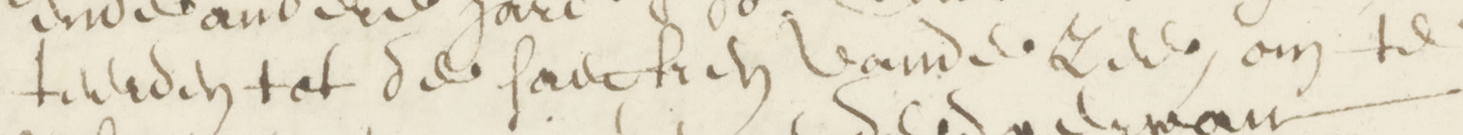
teerden tot de saecken vande Zee, om te
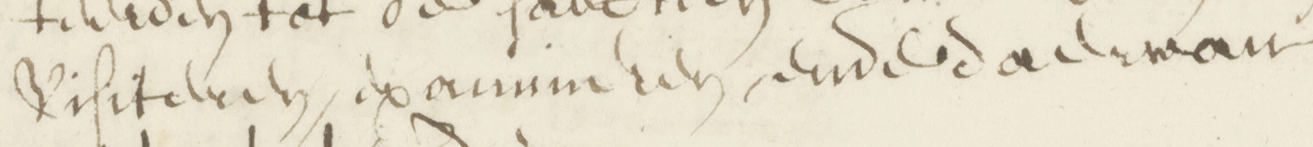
Visiteren, examineren, ende daervan
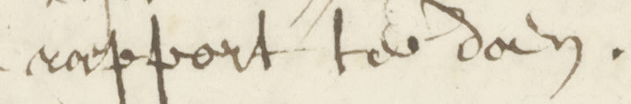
rapport te doen.
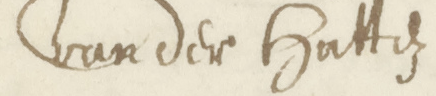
van der Hutten
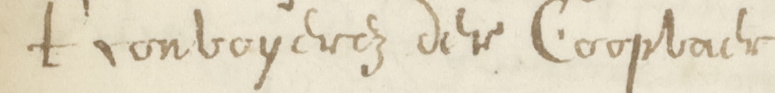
t'convoijeren der Coopvaer„
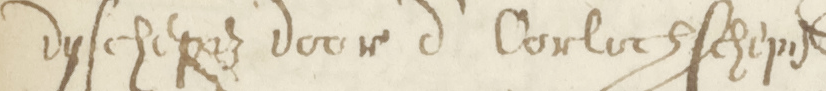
dyschepen door d' Oorlochschepen
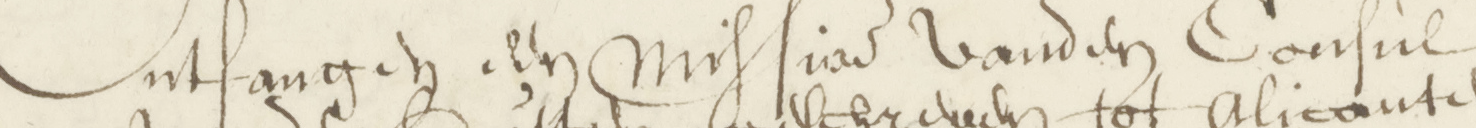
Ontfangen een Missive vanden Consul
